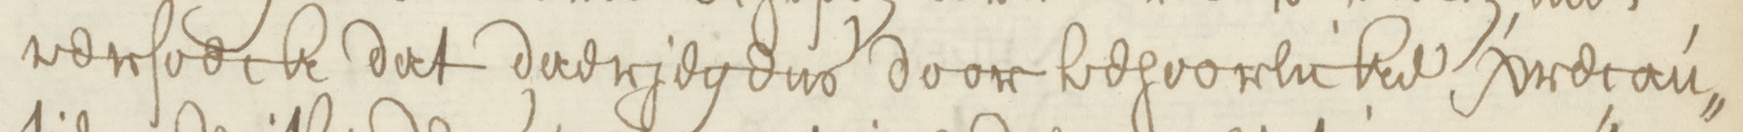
versoeck dat daerjegens door behoorlicke precau„
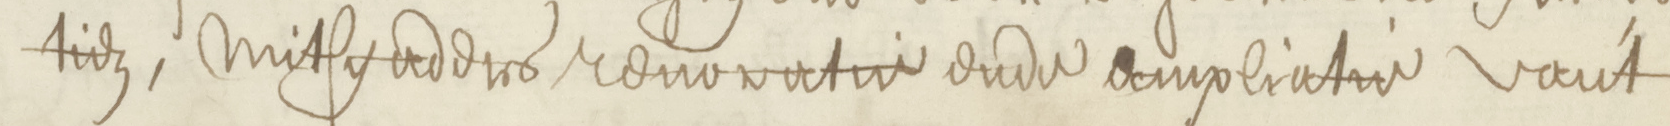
tien, mitsgaders renovatie ende ampliatie van't
